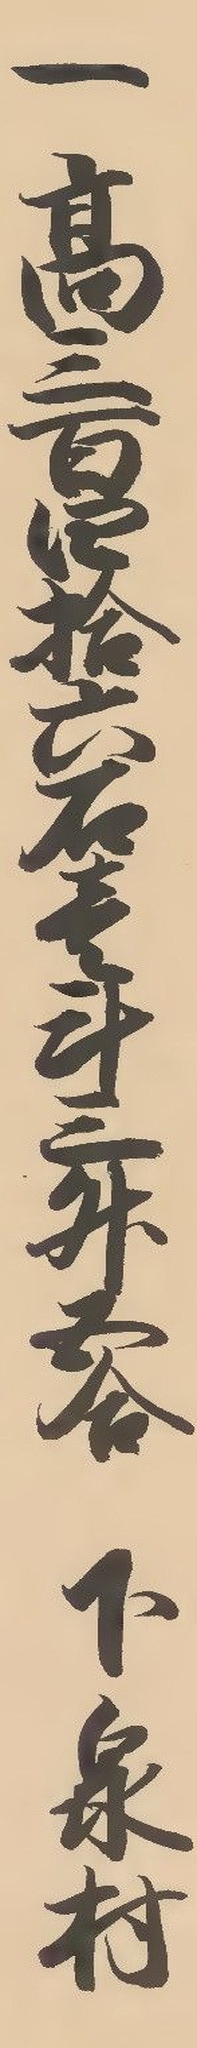一高三百四拾六石壱斗三升五合下泉村
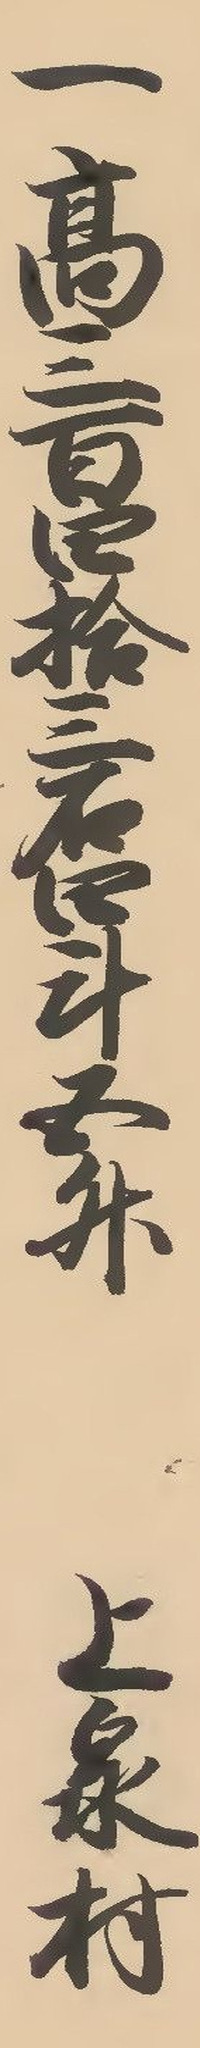一高三百四拾三石四斗五升上泉村
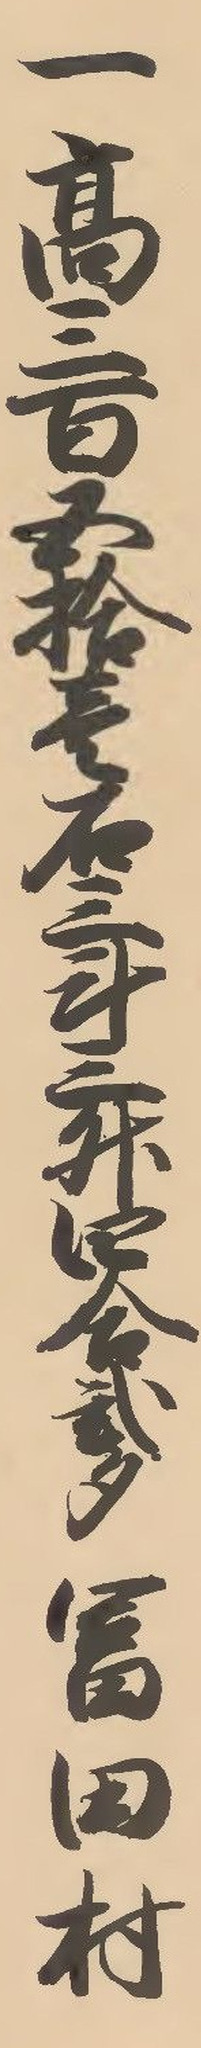一高三百五拾壱石三斗三升四合弐勺富田村
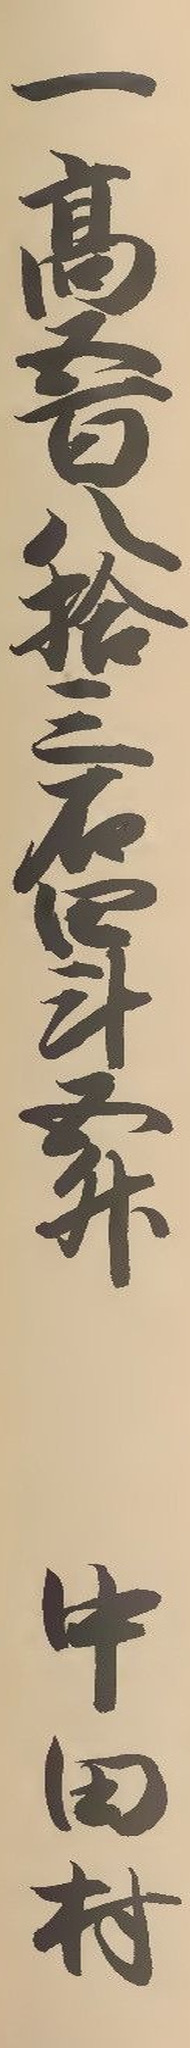一高五百八拾三石四斗五升中田村
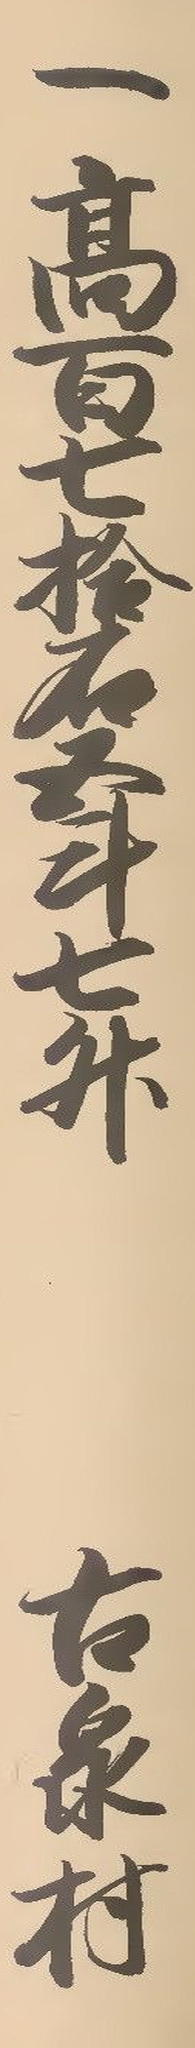一高百七拾石五斗七升古泉村
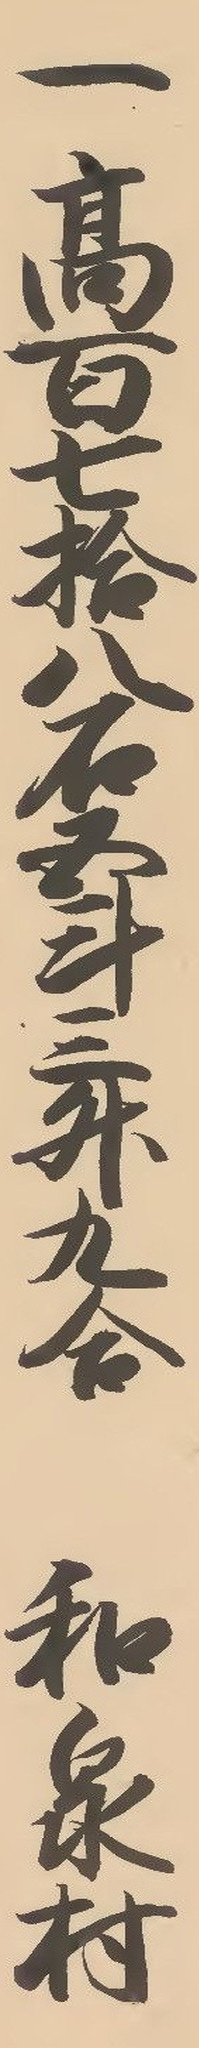一高百七拾八石五斗三升九合和泉村
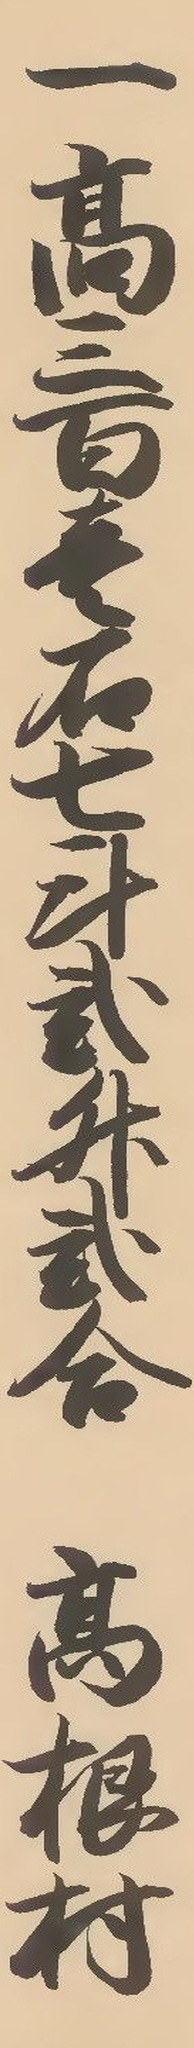一高三百壱石七斗弐升弐合高根村
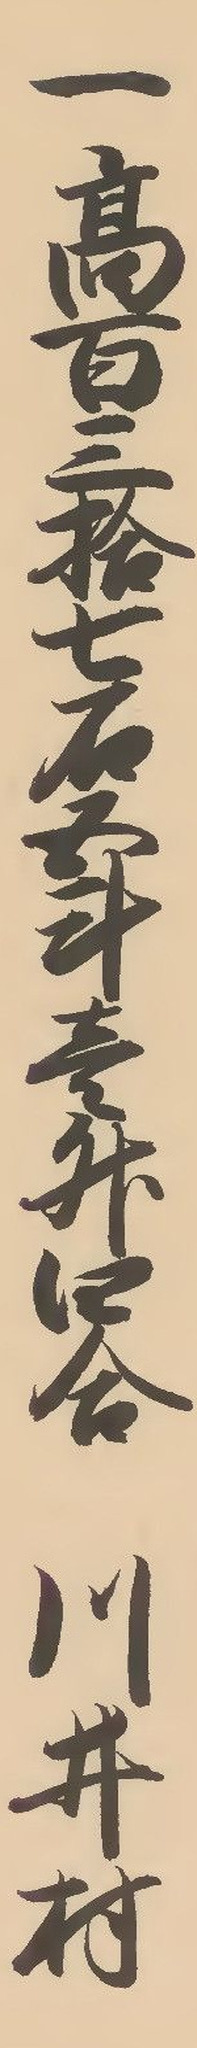一高百三拾七石五斗壱升四合川井村

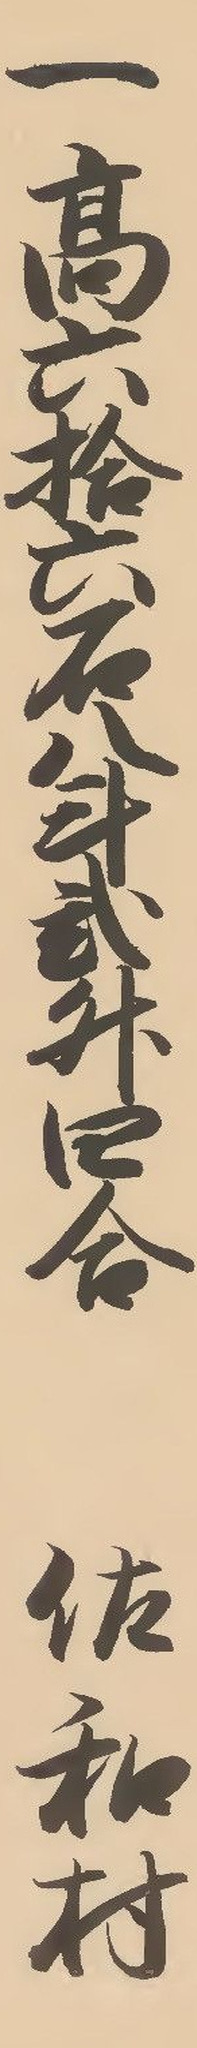一高六拾六石八斗弐升四合佐和村
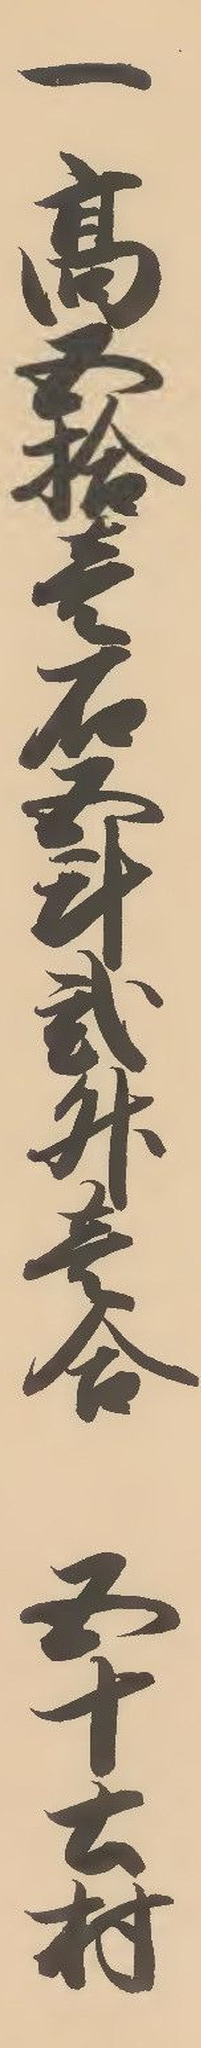一高五拾壱石五斗弐升壱合五十土村
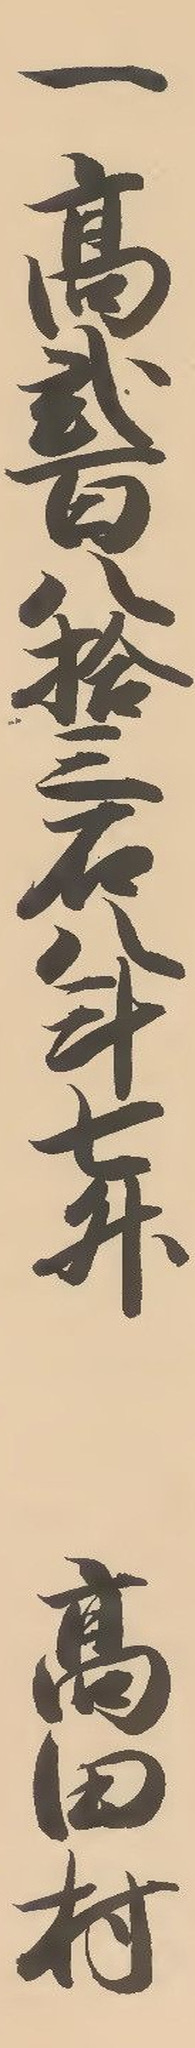一高弐百八拾三石八斗七升高田村
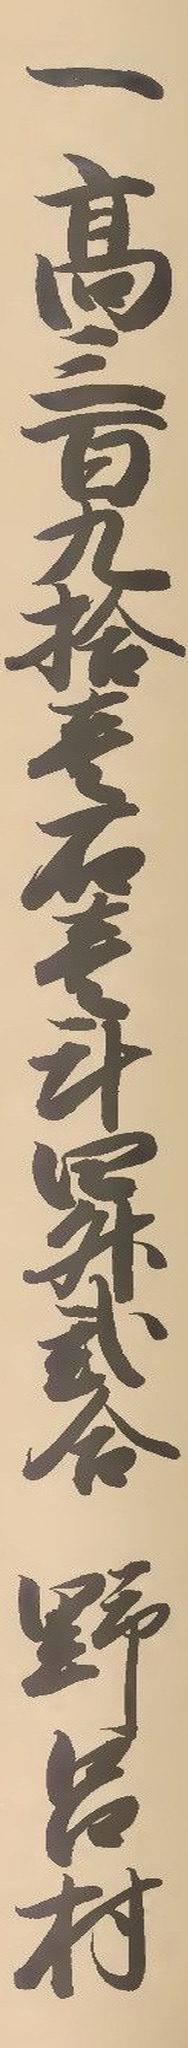一高三百九拾壱石壱斗四升弐合野呂村
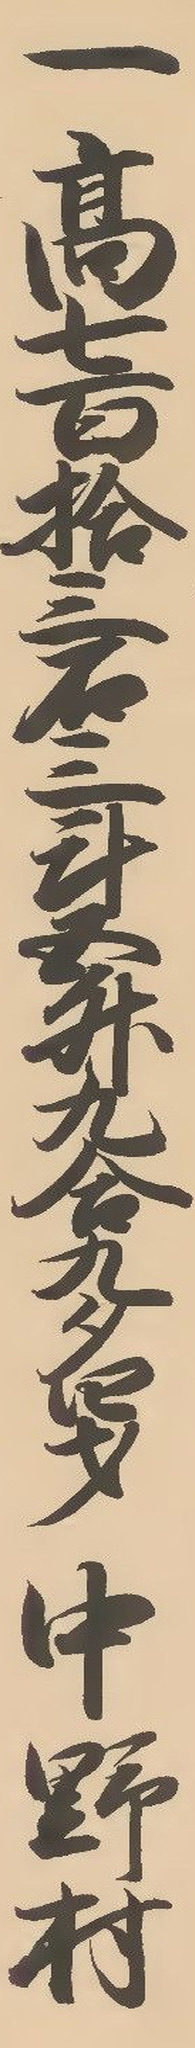一高七百拾三石三斗五升九合九勺四才中野村
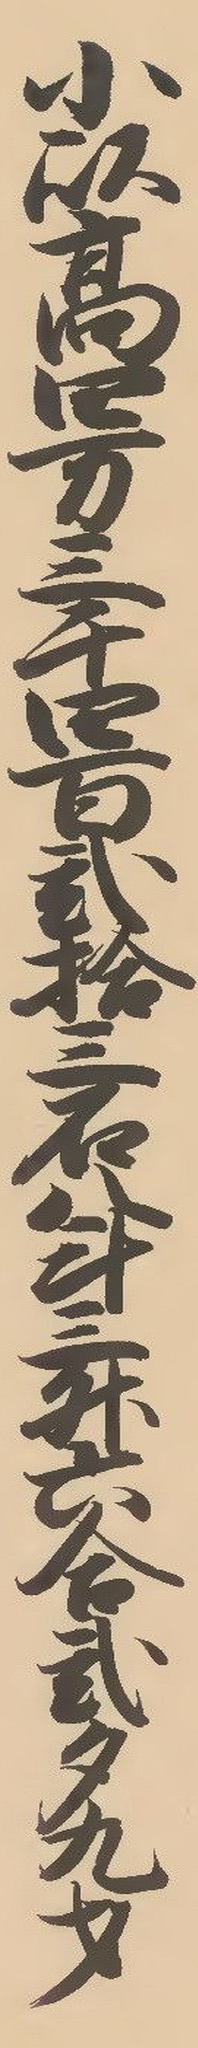小以高四万三千四百弐拾三石八斗三升六合弐勺九才

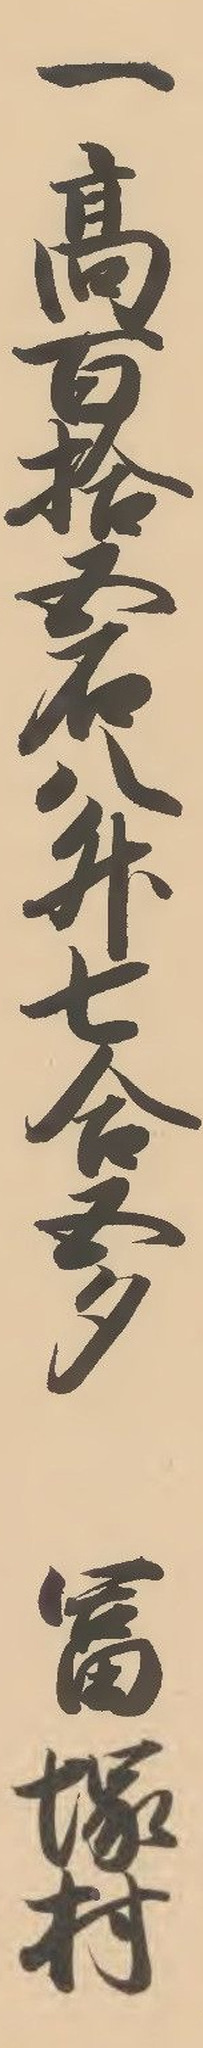一高百拾五石八升七合五勺富塚村
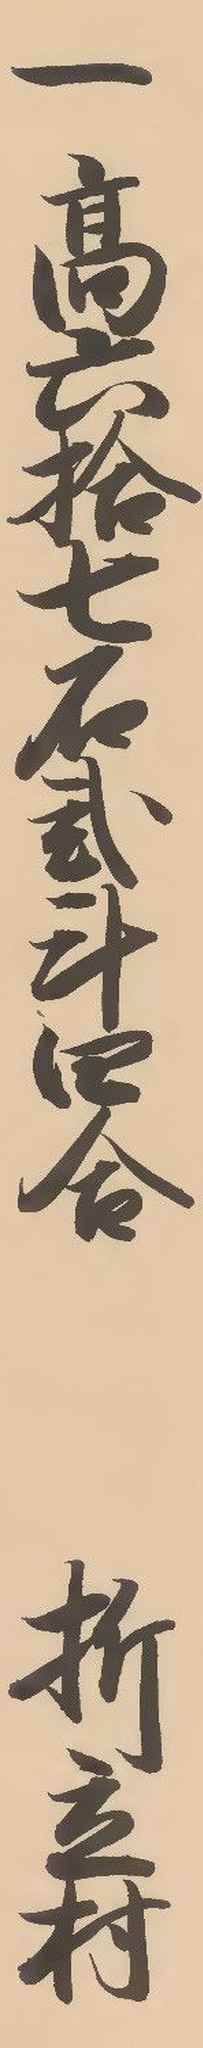一高六拾七石弐斗四合折立村
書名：下総国郷帳
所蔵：国立公文書館 National Archives of Japan
